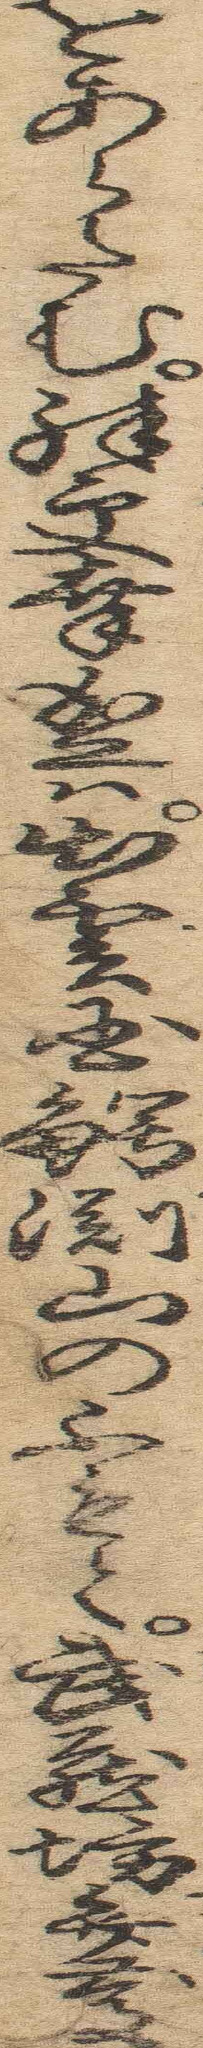をあらたむ殊更幸盛は。出雲国鰐淵山のふもと。武蔵坊弁慶

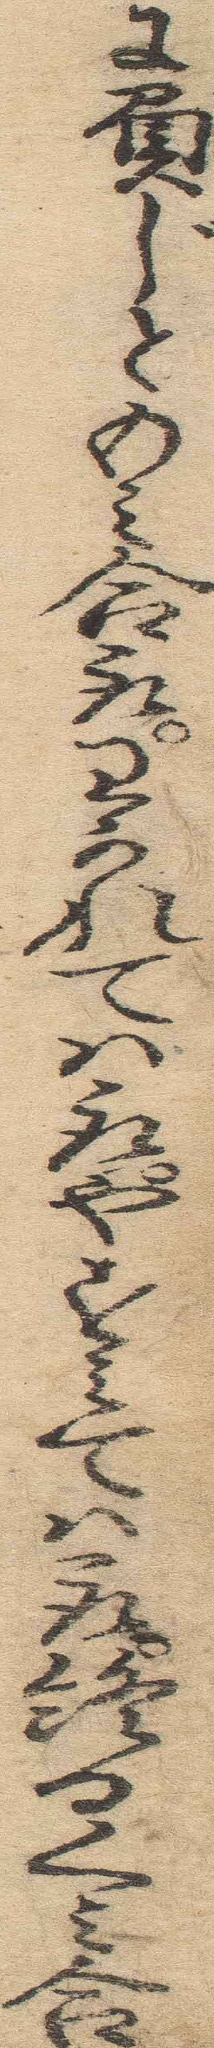に負じともみ合取。わかれては取。やすみては取。終日くみ合
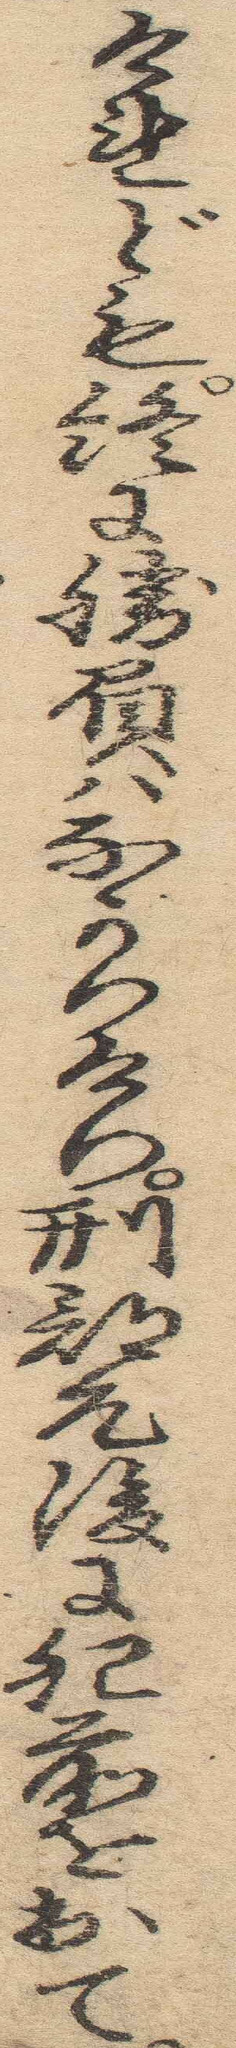けれども。終に勝負はなかりけり。刑部允後に肥前を出て。
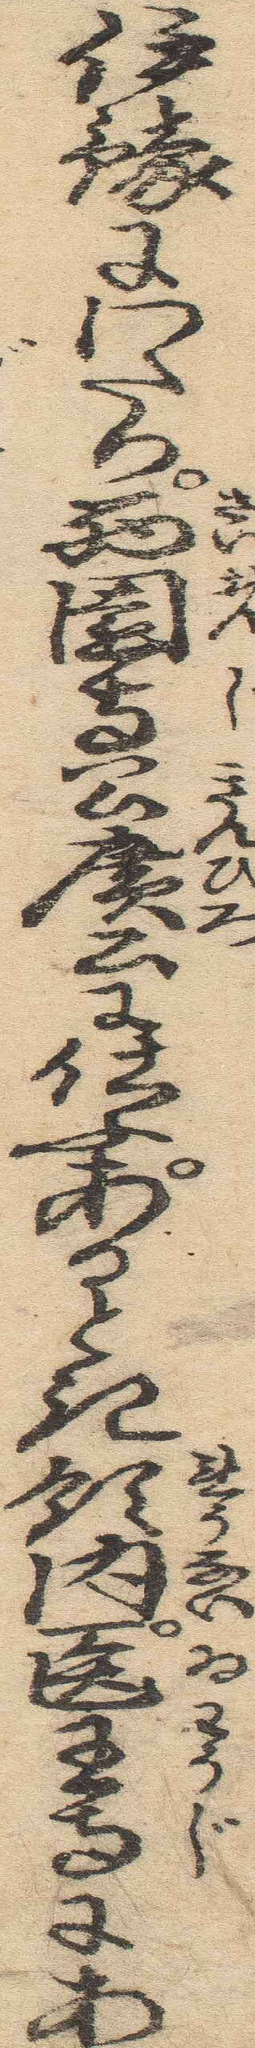伊豫にいたり。西園寺公広公に仕ふ。あるとき領内医王寺にあ
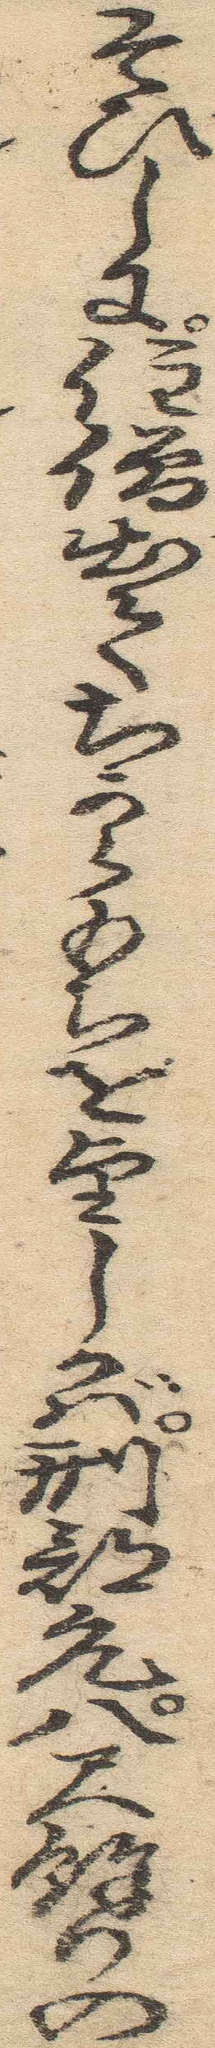そびしに。住僧出てちからもちを望みしかば。刑部允。八尺餘りの
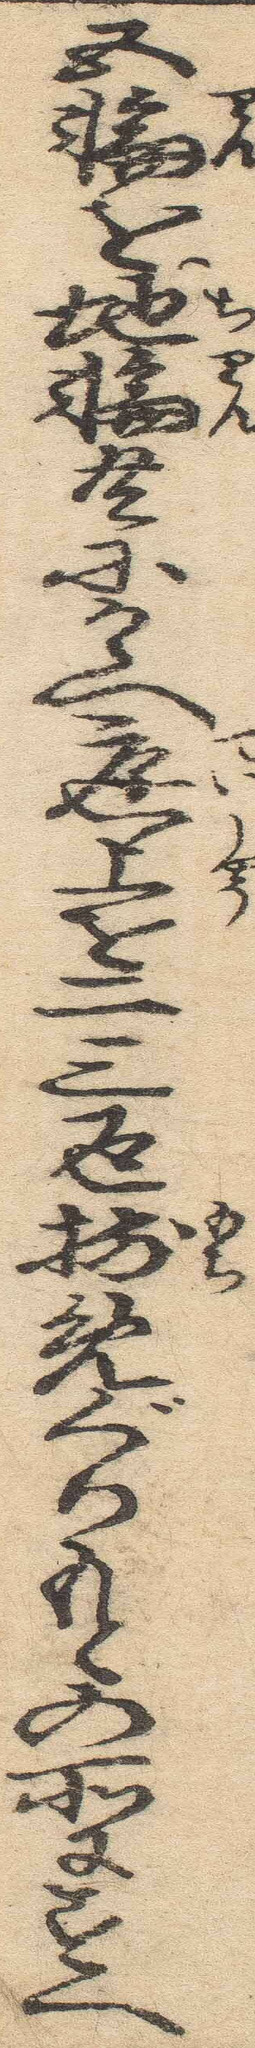五輪を地輪共にかゝへ庭上を二三返持めぐりもとの所にすへ
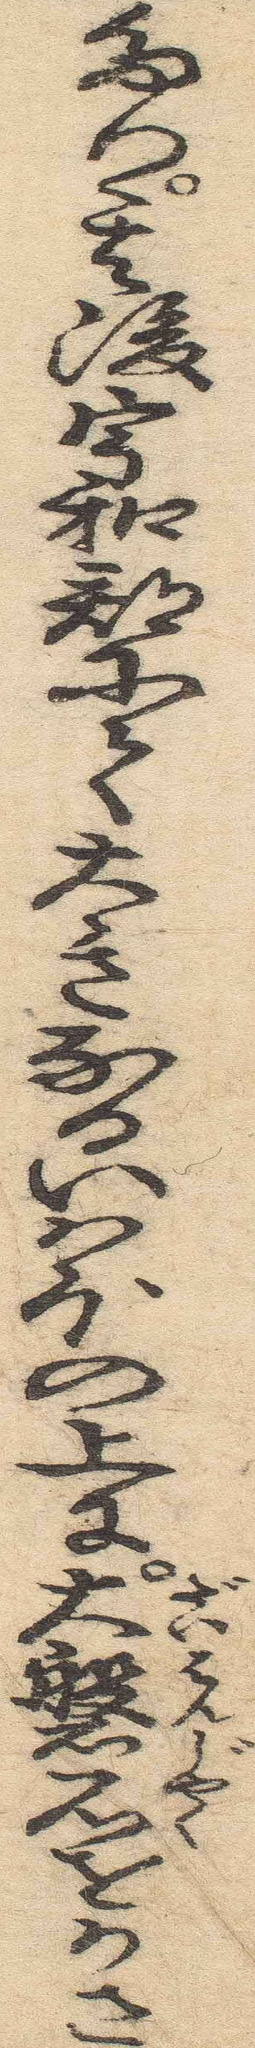たり。其後宇和郡にて大きなるいはほの上に大盤石をかさ
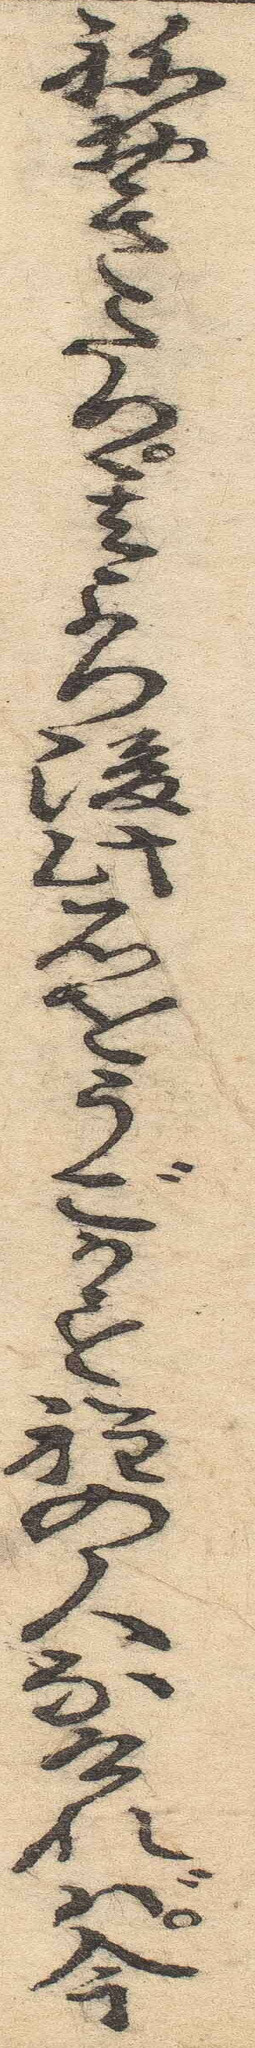ねおきたり。其より後此石をうごかす程の人なければ。今
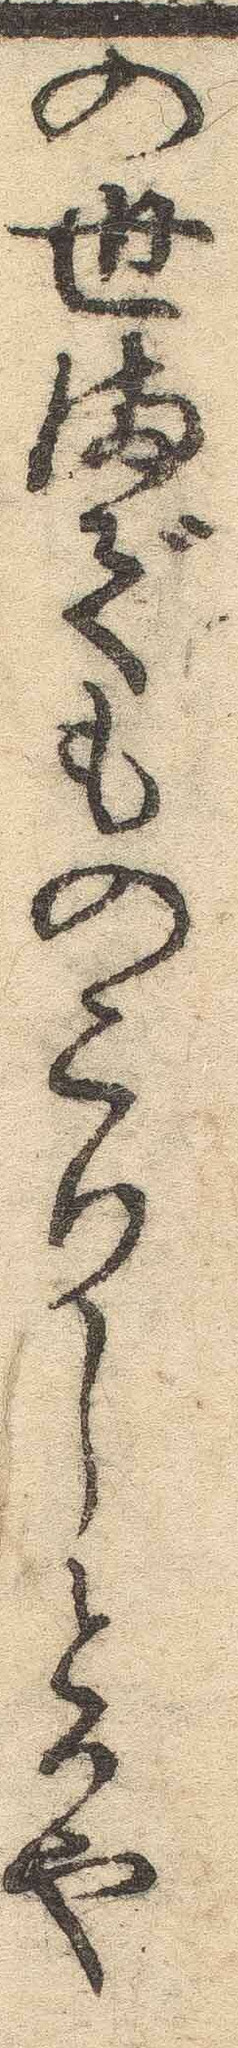の世までものこりしとかや
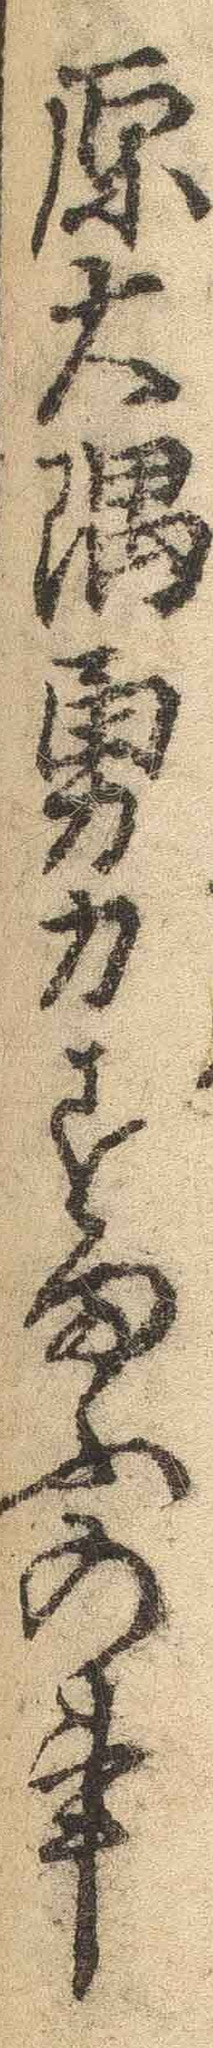原大隅勇力すまふの事
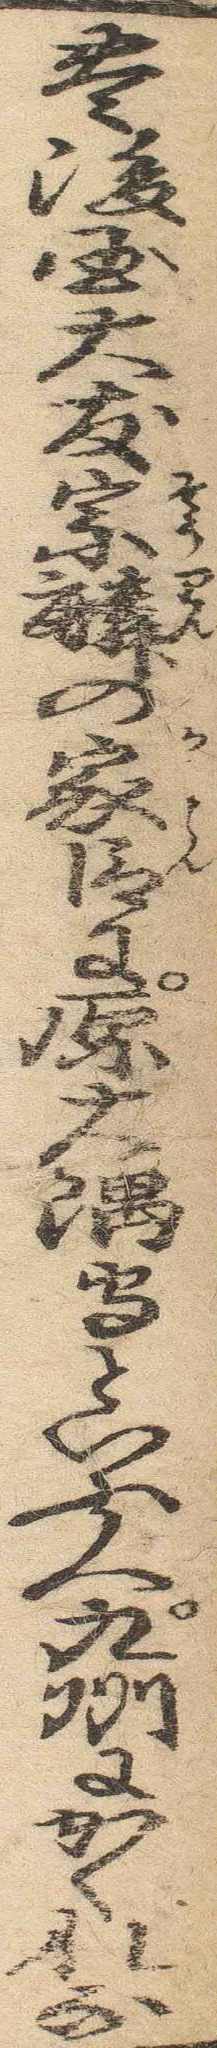豊後国大友宗麟の家臣に。原大隅守といふ人。九州にかくれな
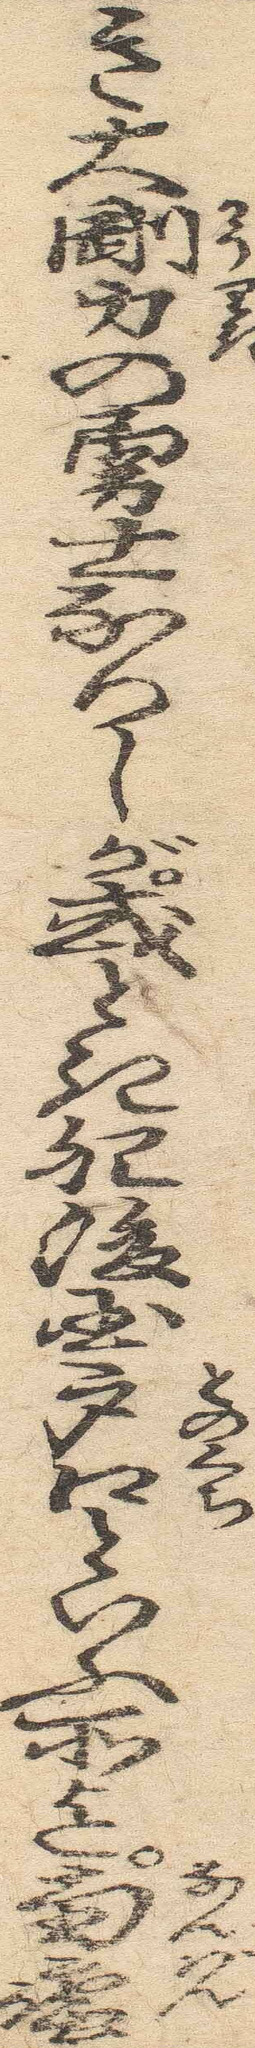き大剛力の勇士なりしが。或とき肥後国戸口といふ所迄。南蛮
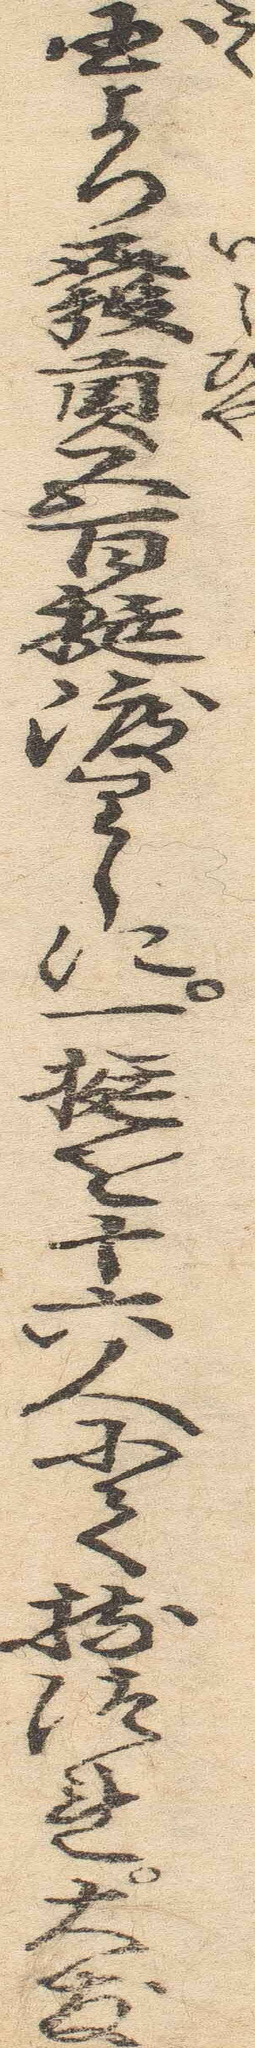国より発貢五百挺渡りしに。一挺を十六人にて持つれ。大友
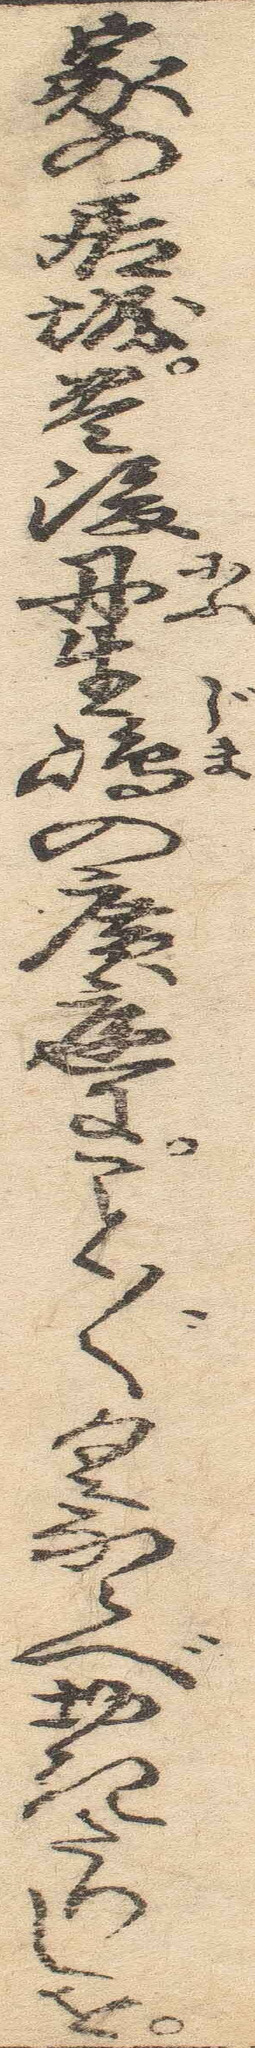家の居城。豊後丹生嶋の広庭にこと〳〵くならべおきたりしを。
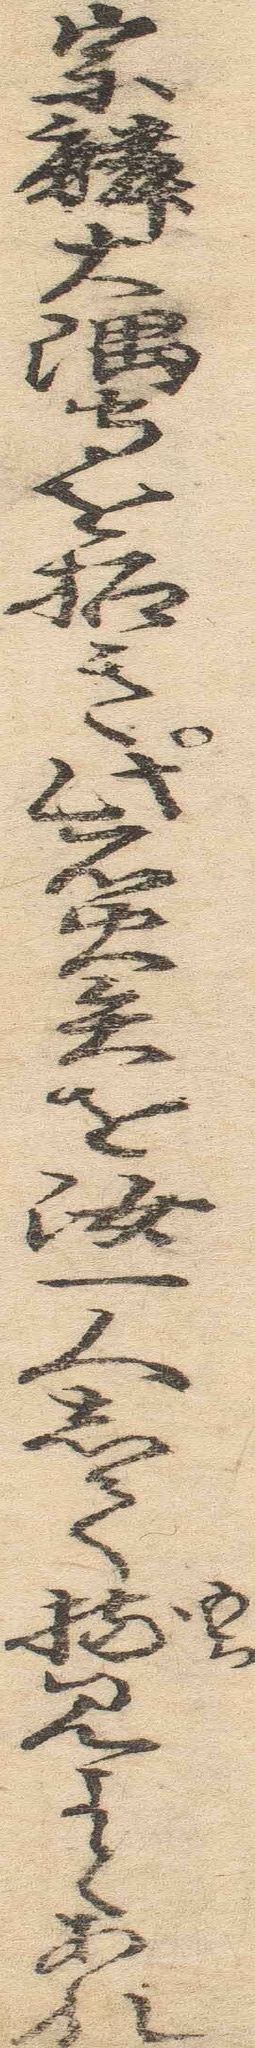宗麟大隅守を招き。此石火矢を汝一人して持見よとあれ
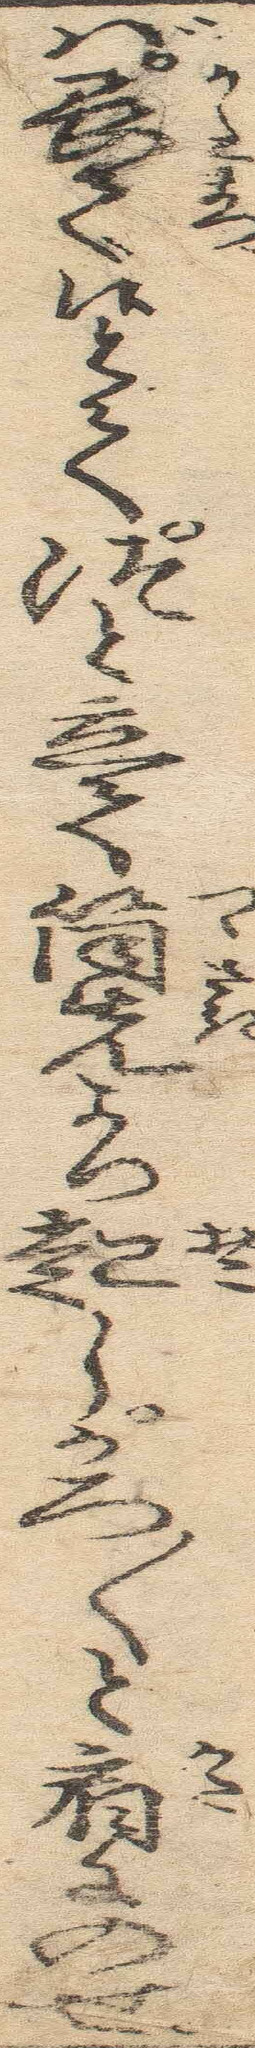ば畏て候とて。つと立て筒先より起し。かろ〳〵と肩にのせ
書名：古今相撲大全
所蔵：東京学芸大学附属図書館 国文学研究資料館
